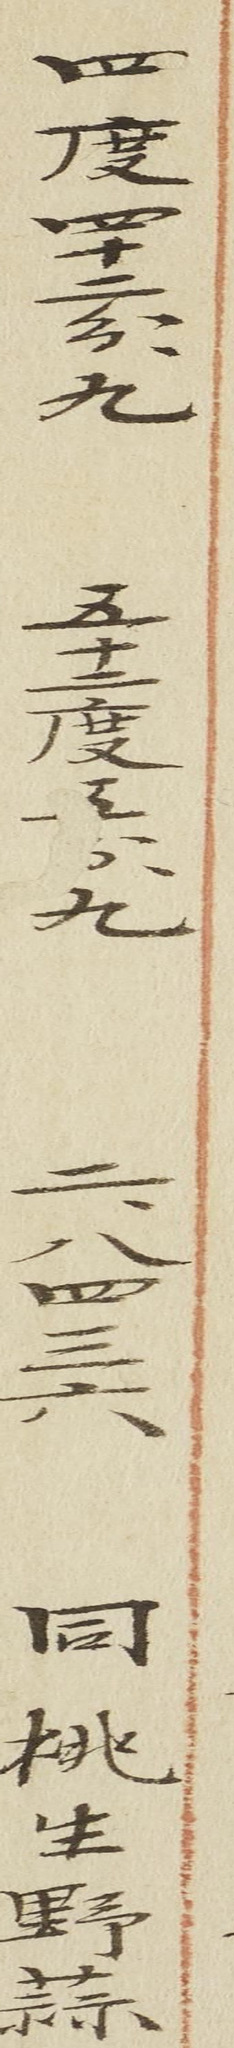四度四十二分、九五十二度五分、九二、八四三六同桃生野蒜
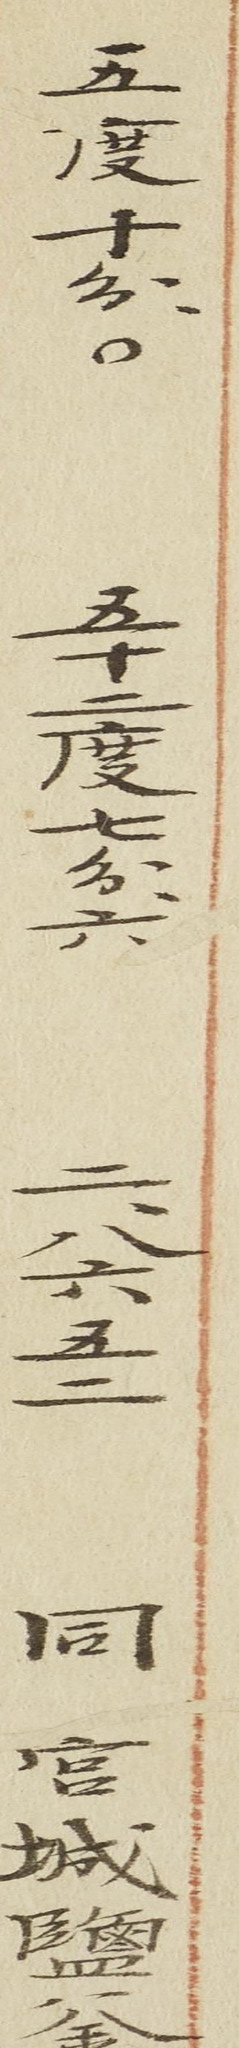五度十分、〇五十二度七分、六二、八六五二同宮城塩釜
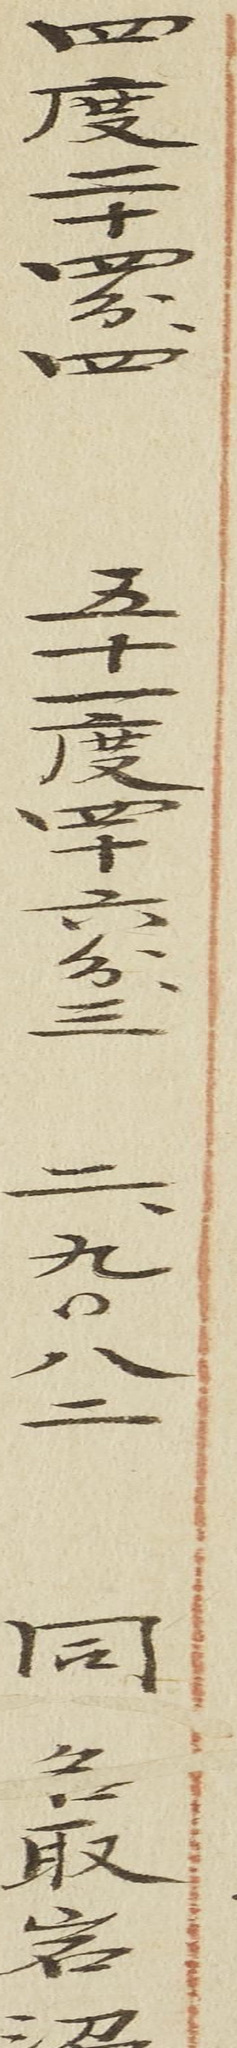四度二十四分、四五十一度四十六分、三二、九〇八二同名取岩沼
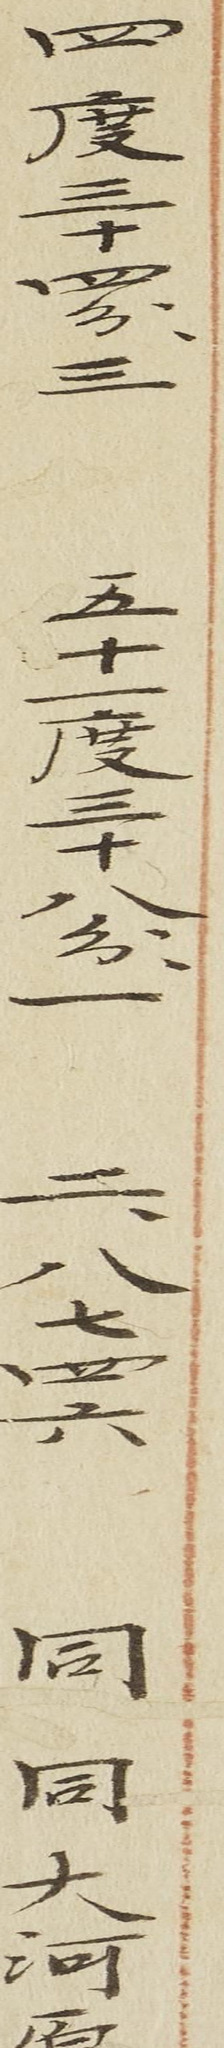四度三十四分、三五十一度三十八分、一二、八七四六同同大河原
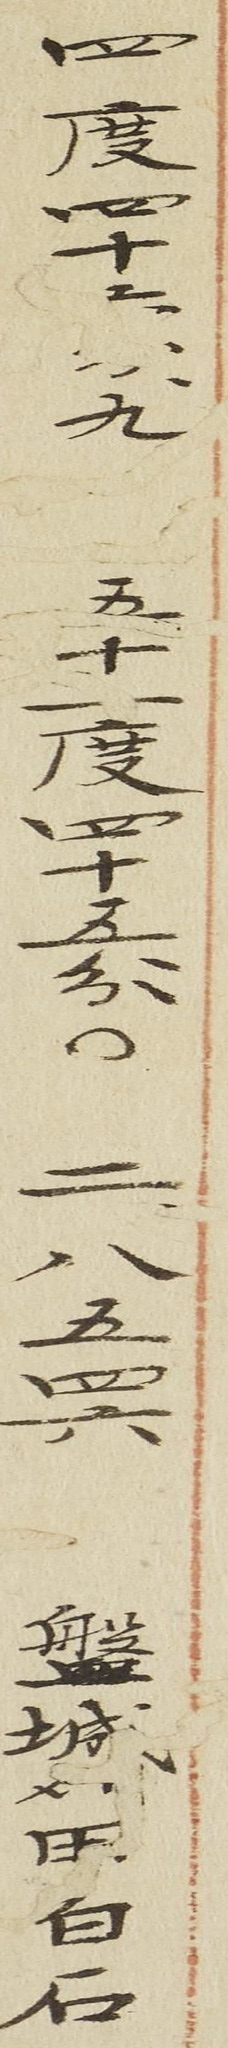四度四十六分、九五十一度四十五分、〇二、八五四六盤城刈田白石

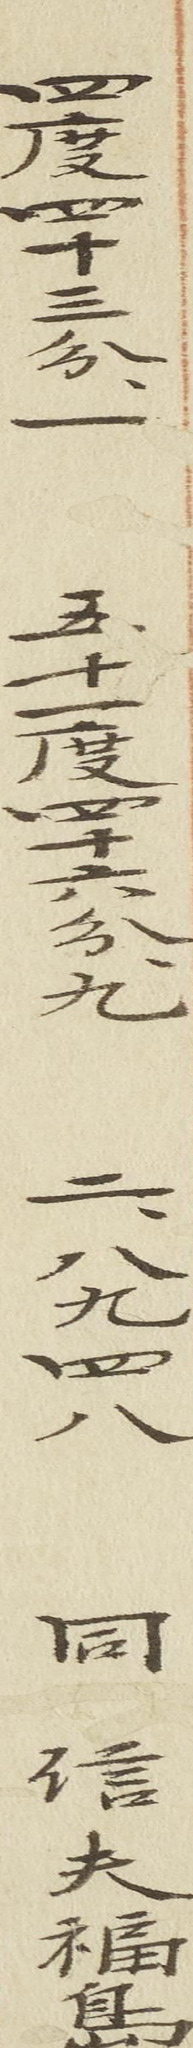四度四十三分、一五十一度四十六分、九二、八九四八同信夫福島
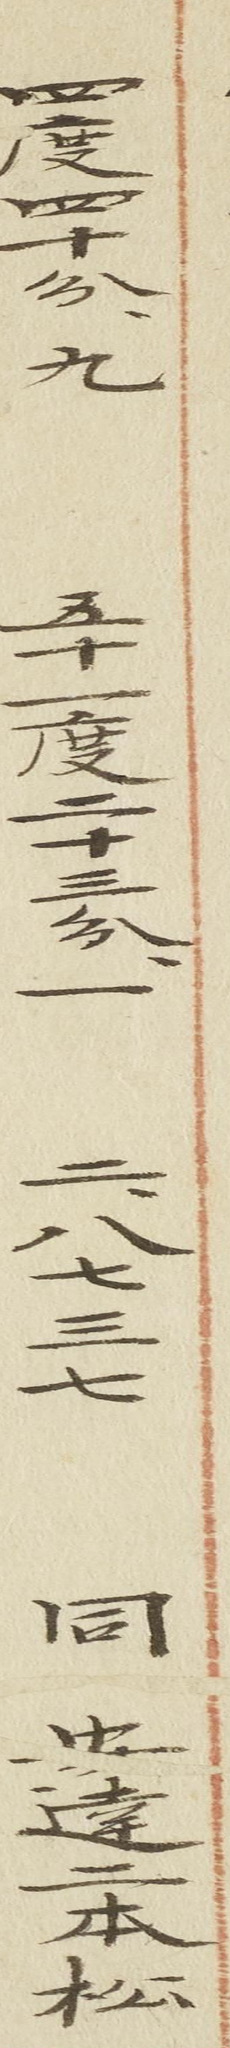四度四十分、九五十一度二十三分、一二、八七三七同安達二本松
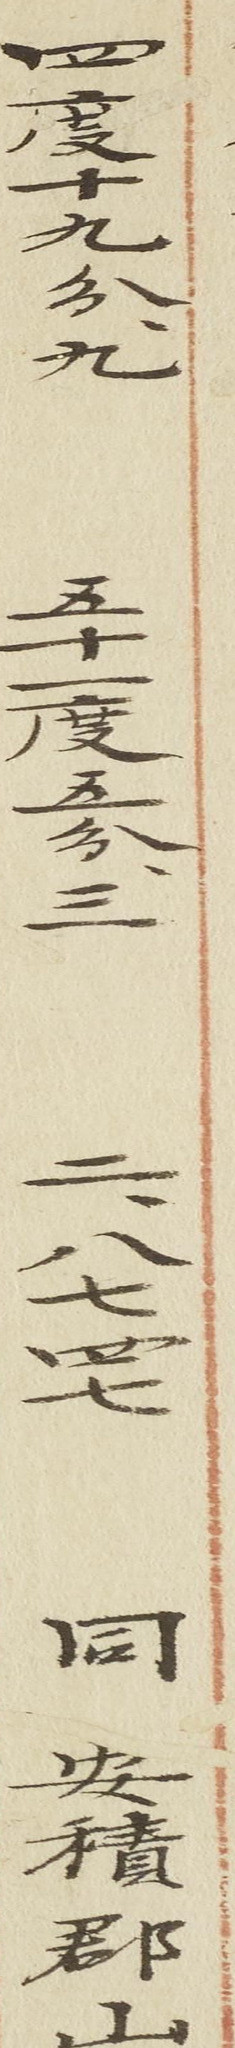四度十九分、九五十一度五分、三二、八七四七同安積郡山
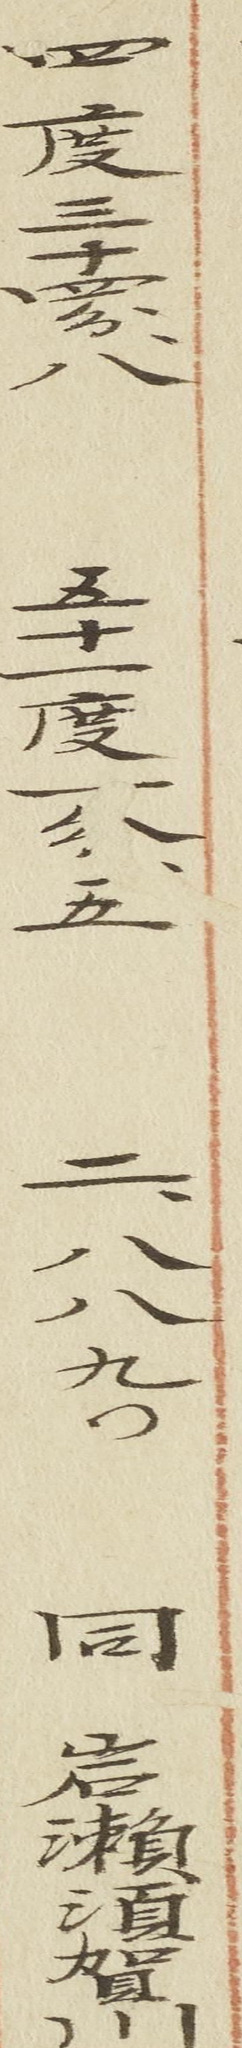四度三十四分、八五十一度一分、五二、八八九〇同岩瀬須賀川
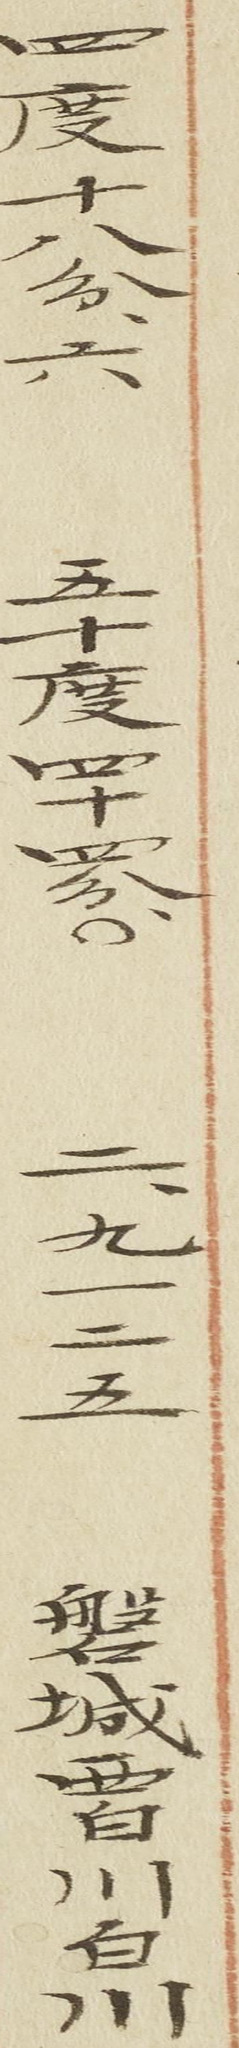四度十八分、六五十度四十四分、〇二、九一二五同磐城西白川白川
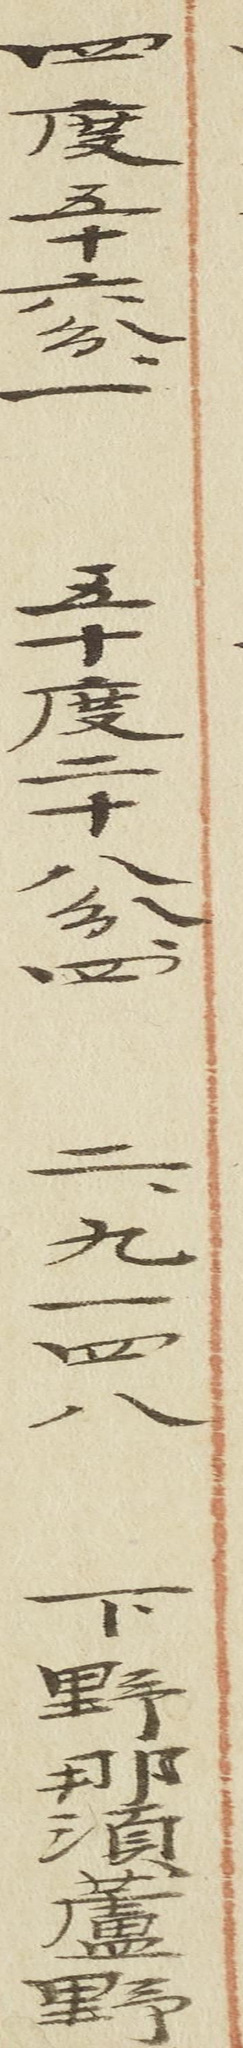四度五十六分、一五十度二十八分、四二、九一四八同下野那須蘆野
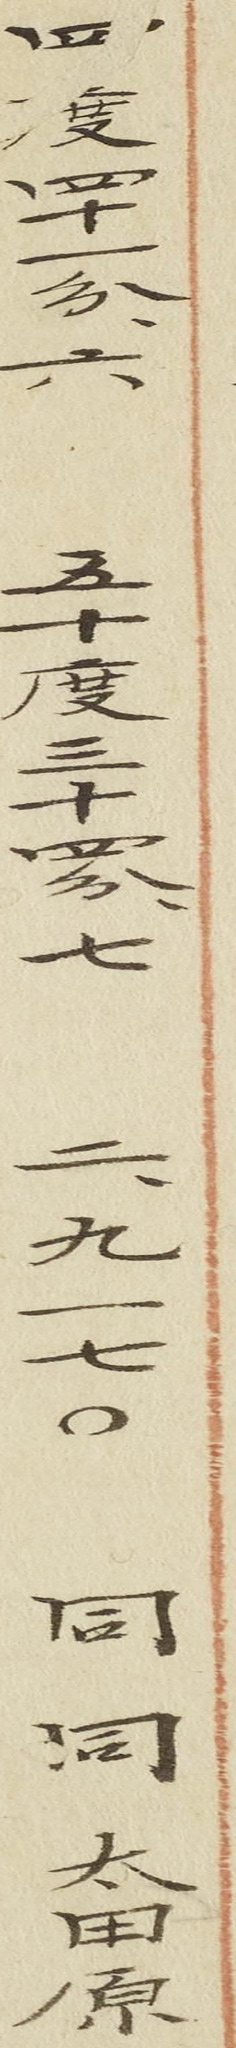四度四十一分、六五十度三十四分、七二、九一七〇同同太田原
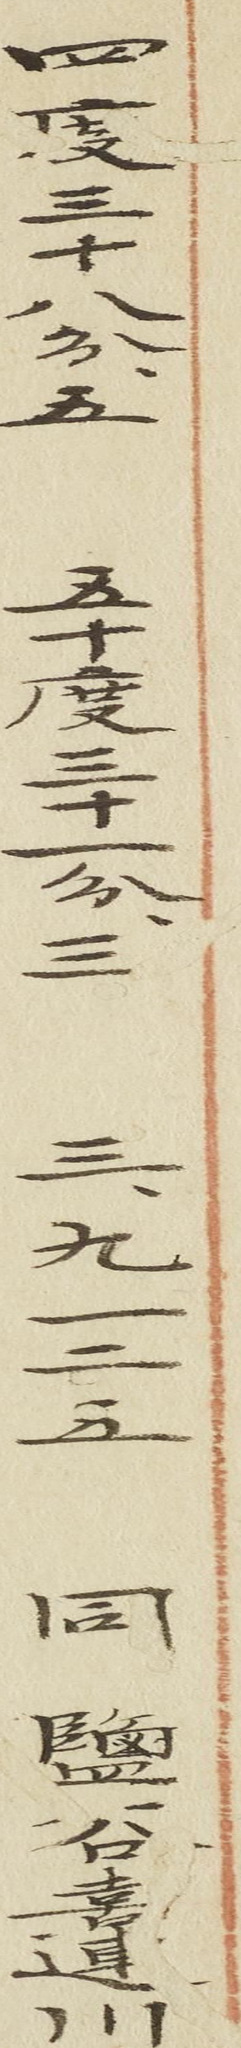四度三十八分、五五十度三十一分、三二、九一二五同塩谷喜連川
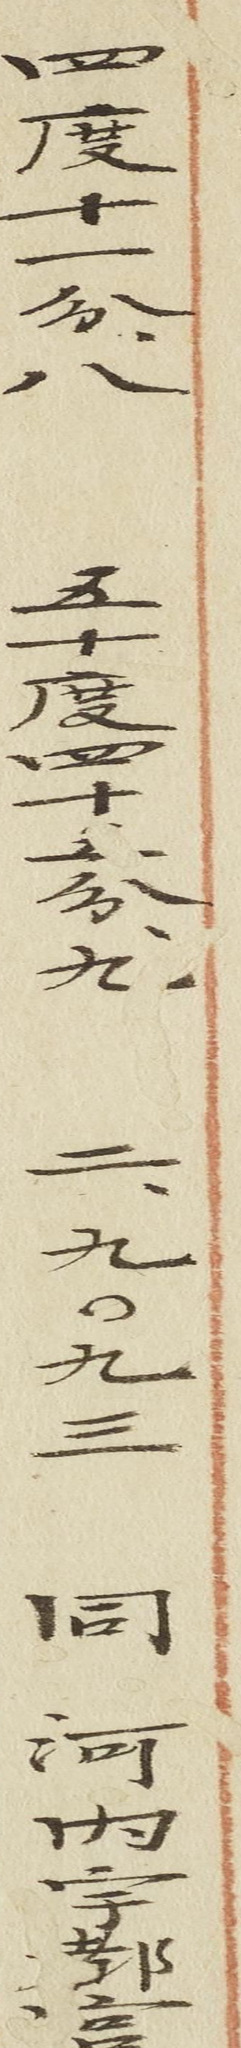四度十一分、八五十度四十五分、九二、九〇九三同河内宇都宮
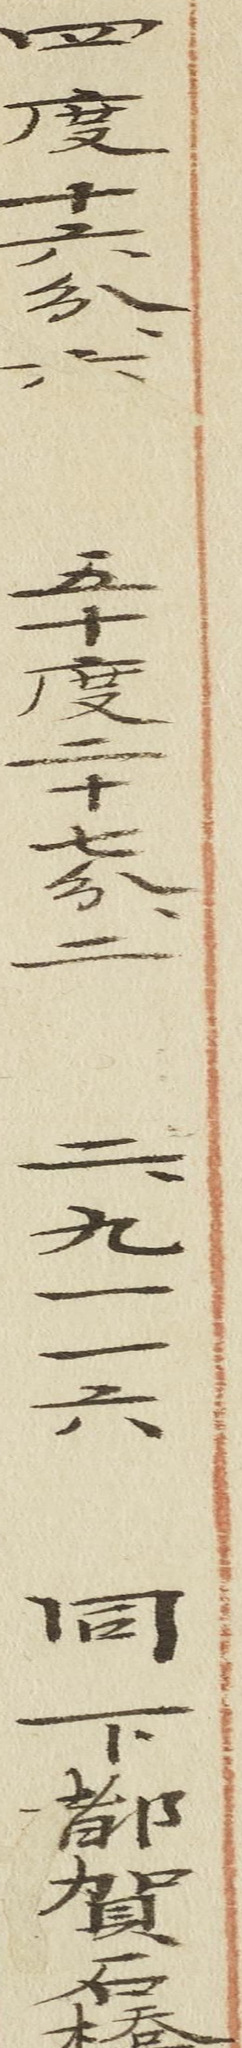四度十六分、六五十度二十七分、二二、九一一六同下都賀石橋
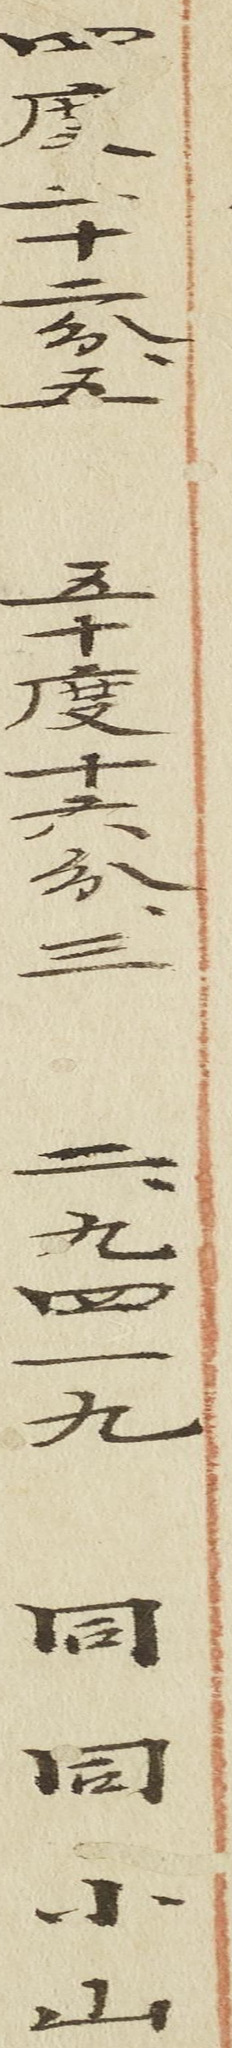四度二十二分、五五十度十六分、三二、九四一九同同小山
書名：鑷力観測報告
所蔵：東京大学地震研究所図書室 Earthquake Research Institute Library, The University of Tokyo, JAPAN
